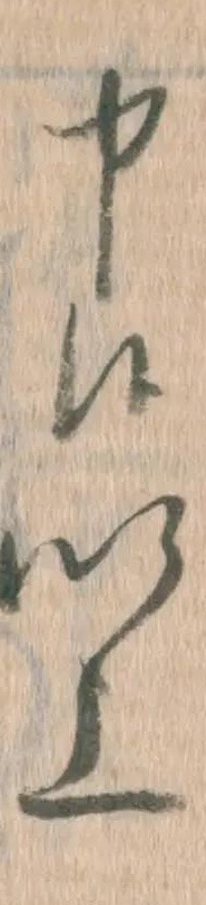申候以上
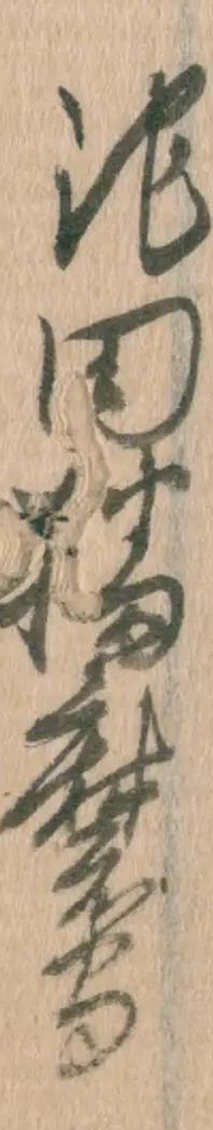池田播磨守
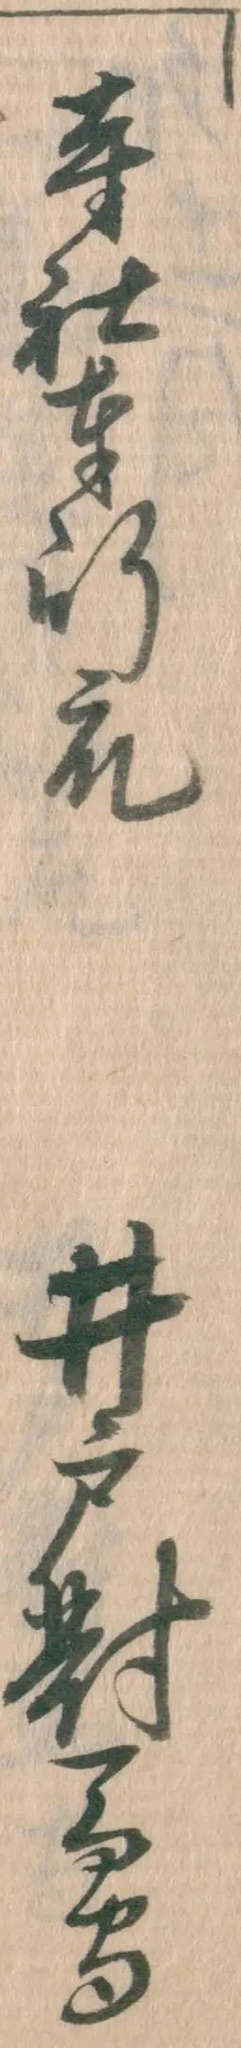寺社奉行衆井戸対馬守
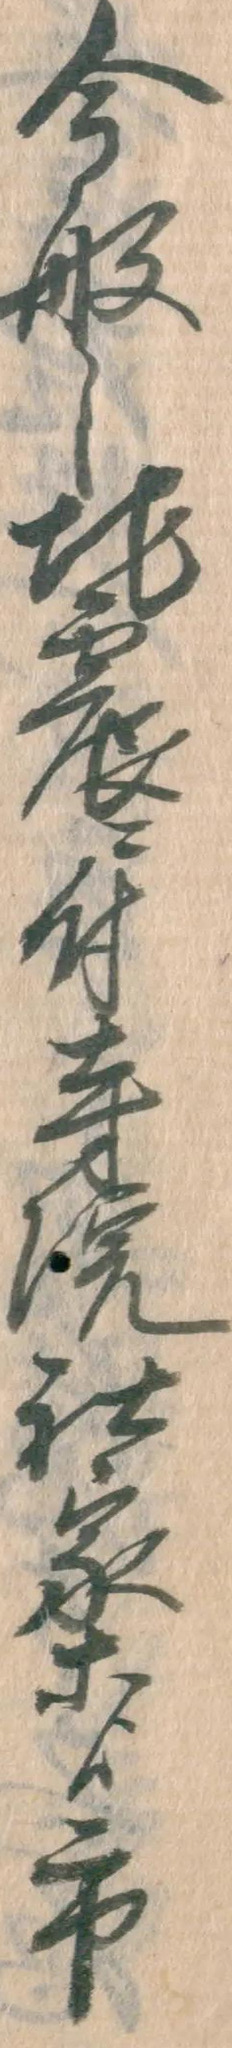今般之地震ニ付寺院社家等ゟ市
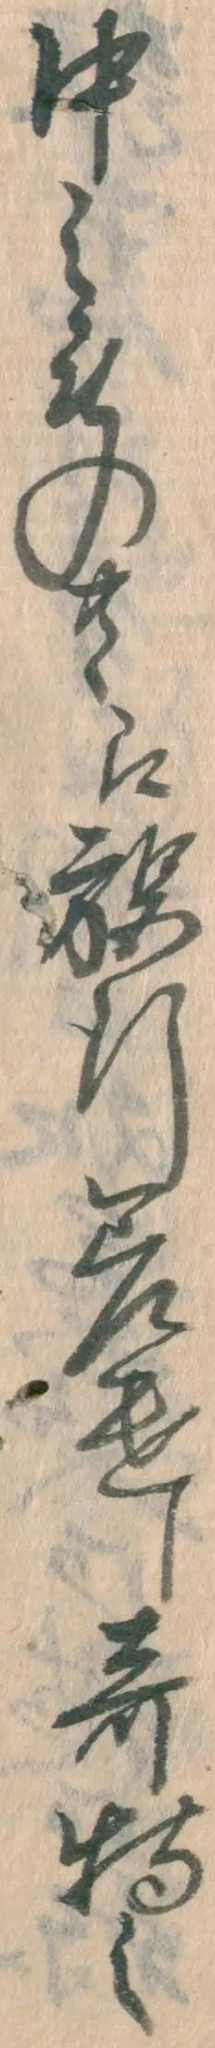中之もの共え施行差遣し奇特之

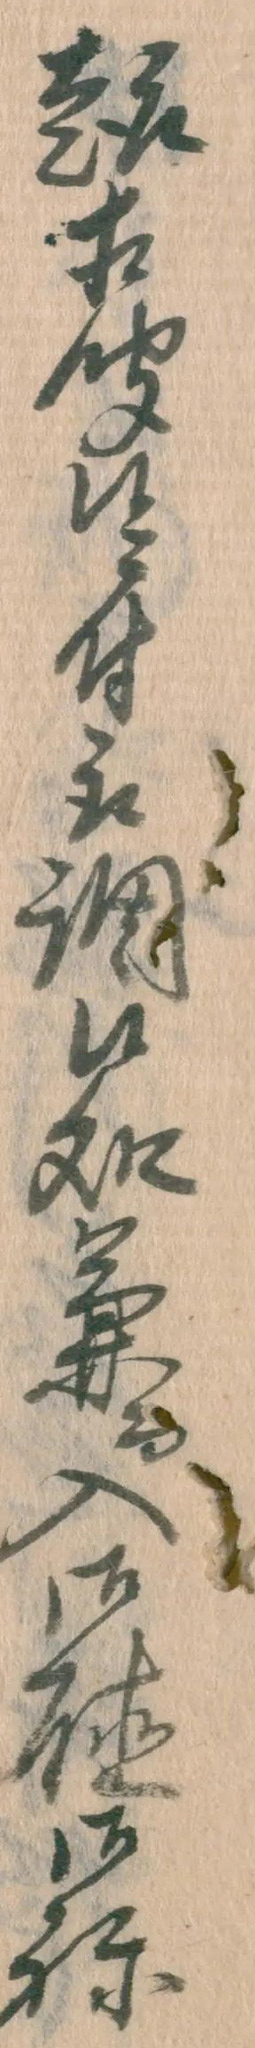趣相聞候ニ付取調候処兼而入御聴御称
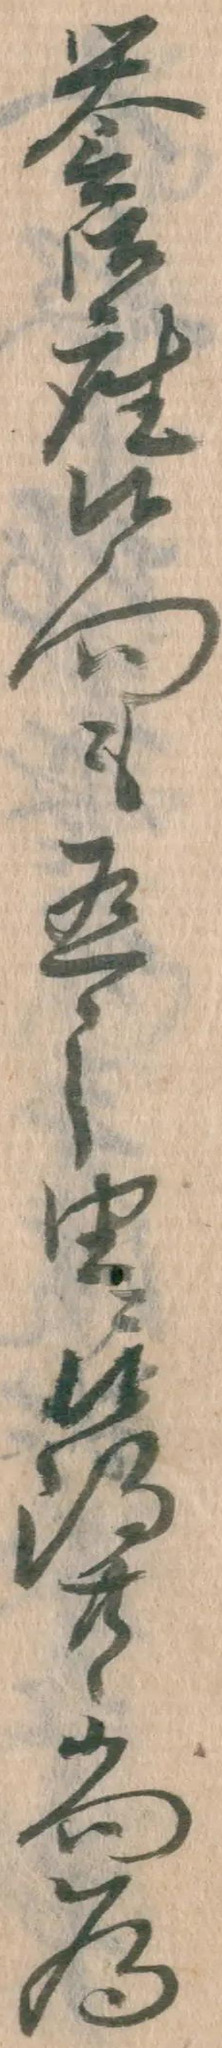誉御座候向も有之由ニ候得共尚為
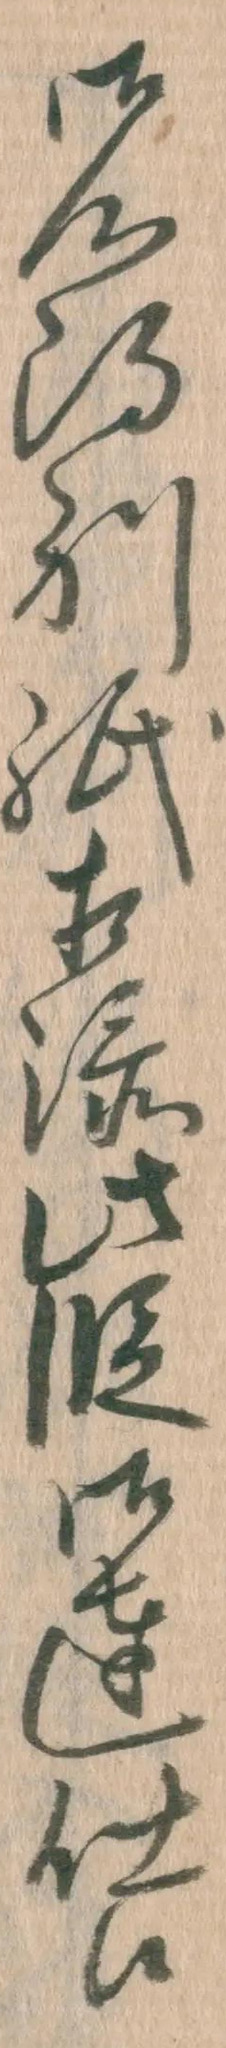御心得別紙相添此段御達仕候
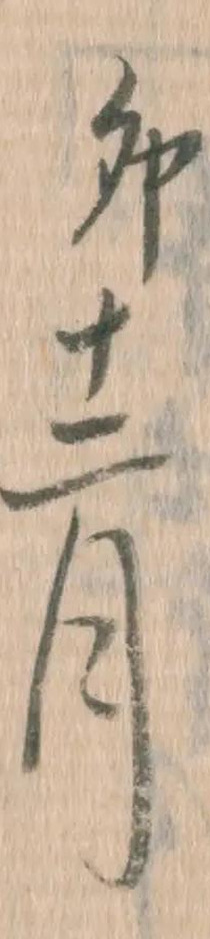卯十二月
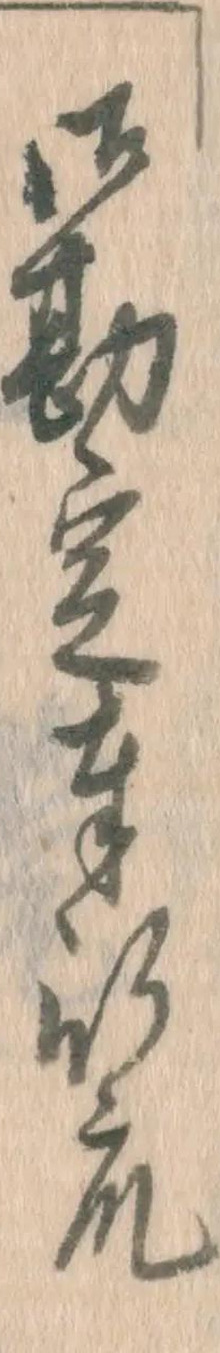御勘定奉行衆
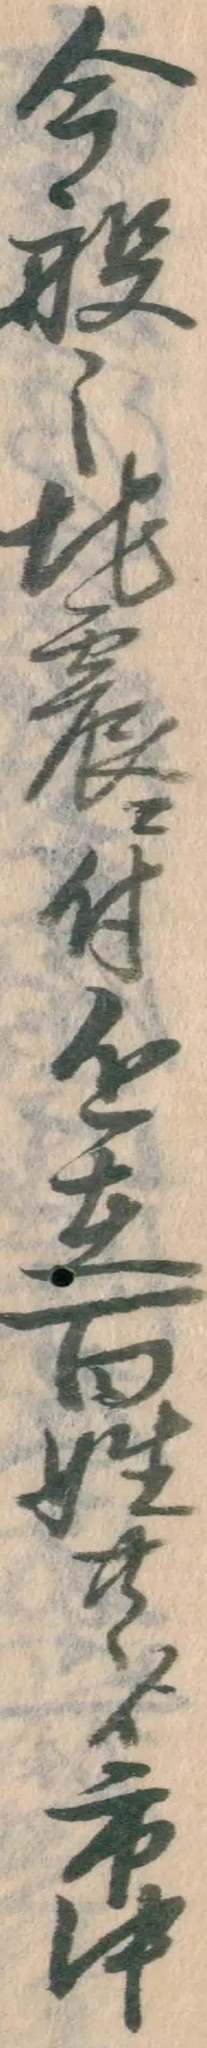今般之地震ニ付近在百姓共ゟ市中
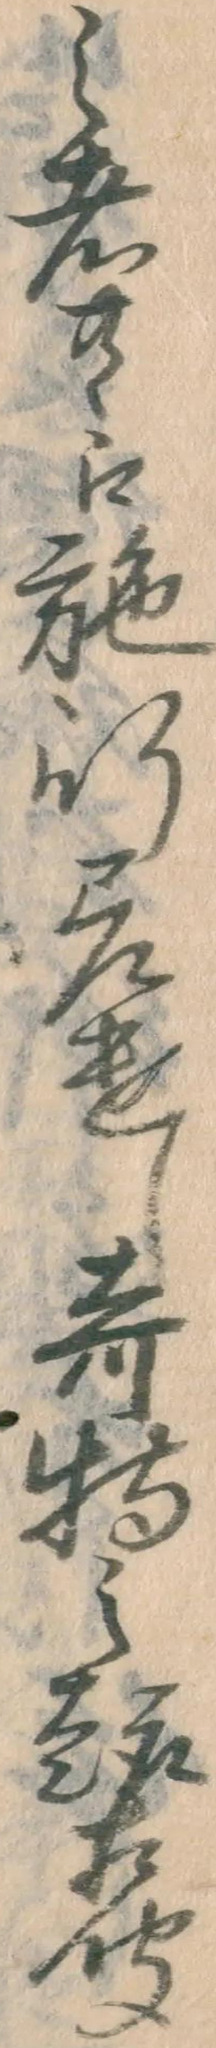之者共え施行差遣し奇特之趣相聞

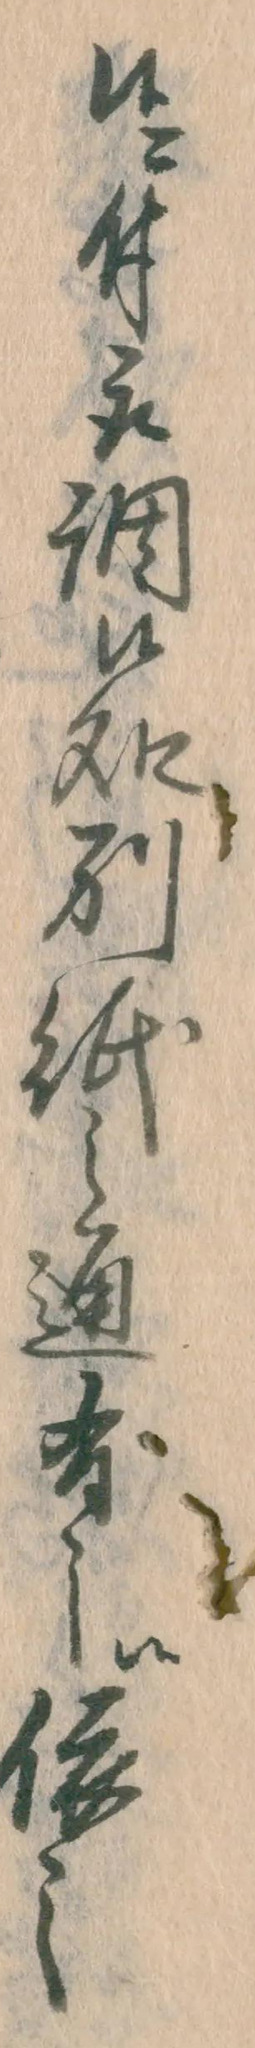候ニ付取調候処別紙之通有之候依之
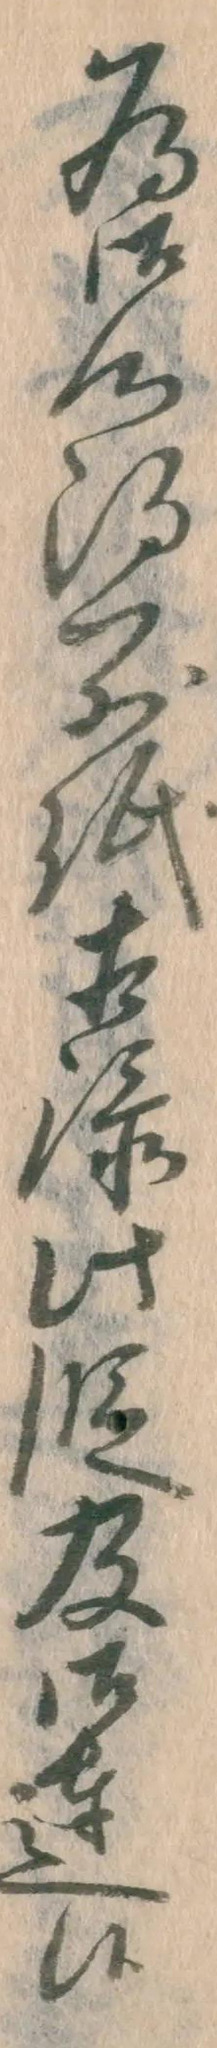為御心得別紙相添此段及御達候
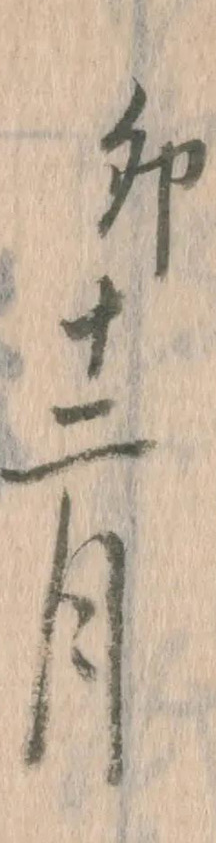卯十二月
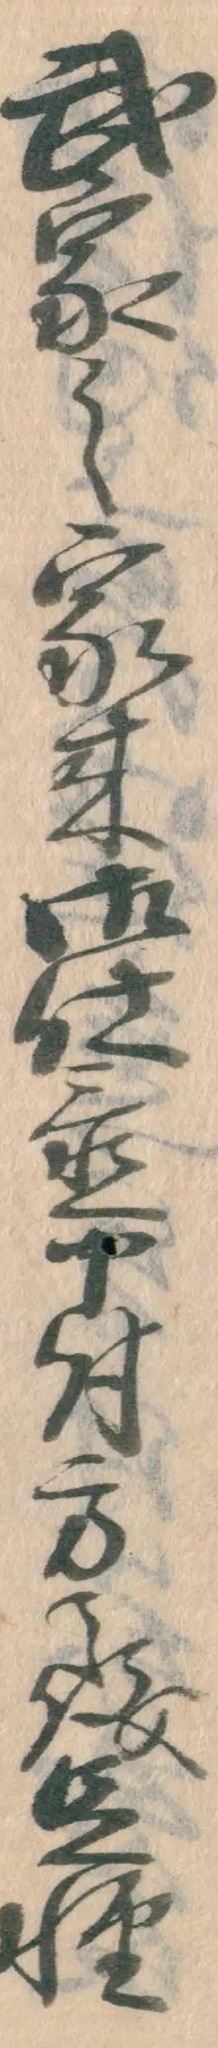武家之家来御仕置申付方之儀足軽
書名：武家方并寺院等ニテ施差出候一件
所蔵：国立国会図書館 National Diet Library, JAPAN
